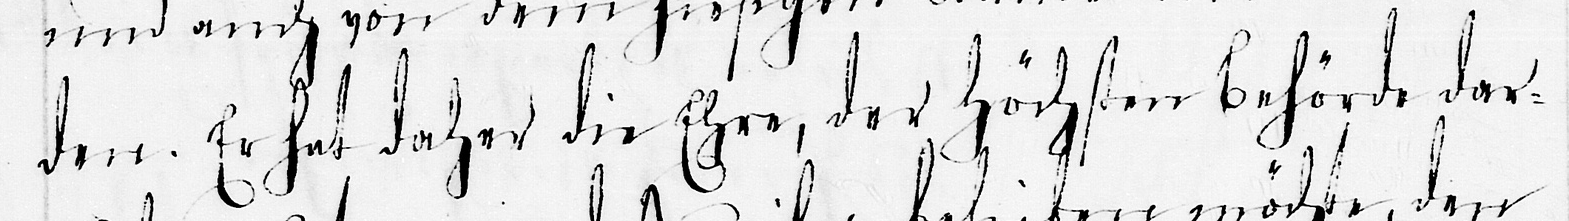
den. Er hat daher die Ehre, der Höchsten Behörde dar¬
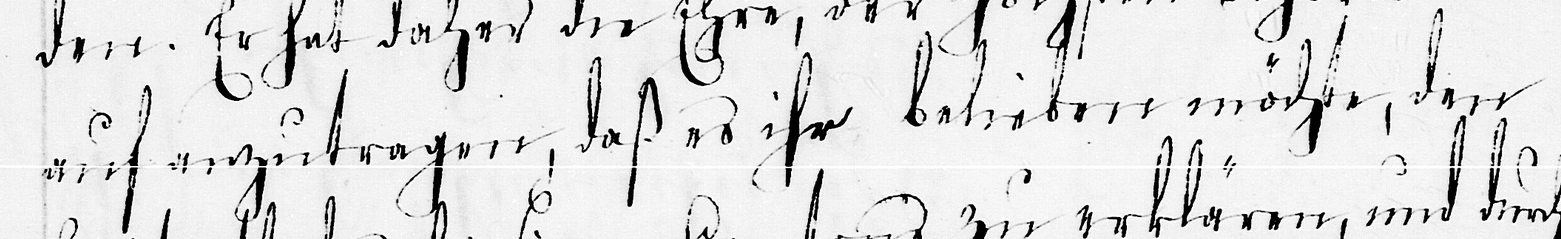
auf anzutragen, daß es ihr belieben möchte, den
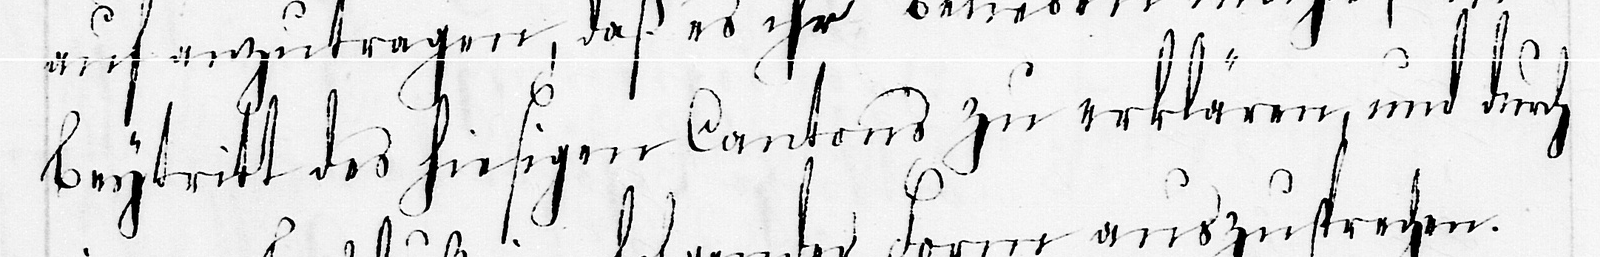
Beytritt des hiesigen Cantons zu erklären, und durch
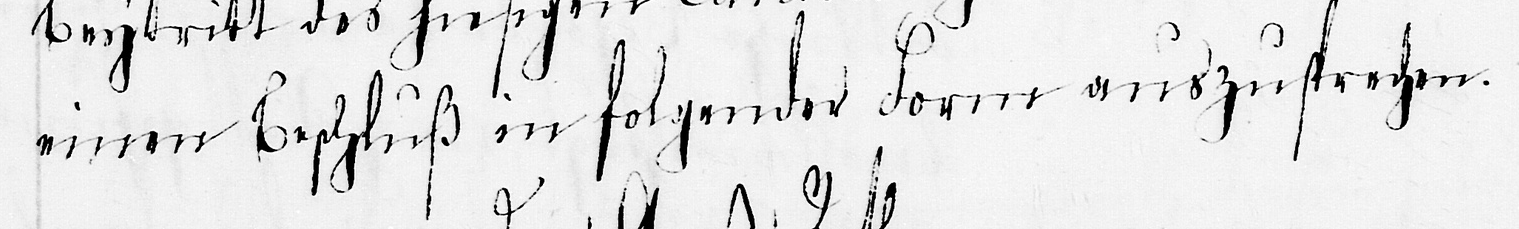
einen Beschluß in folgender Form auszusprechen.
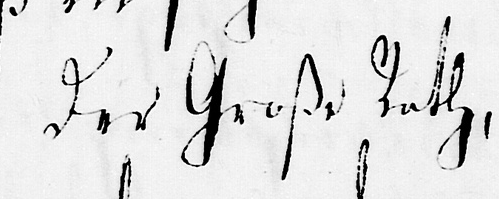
Der Große Rath,
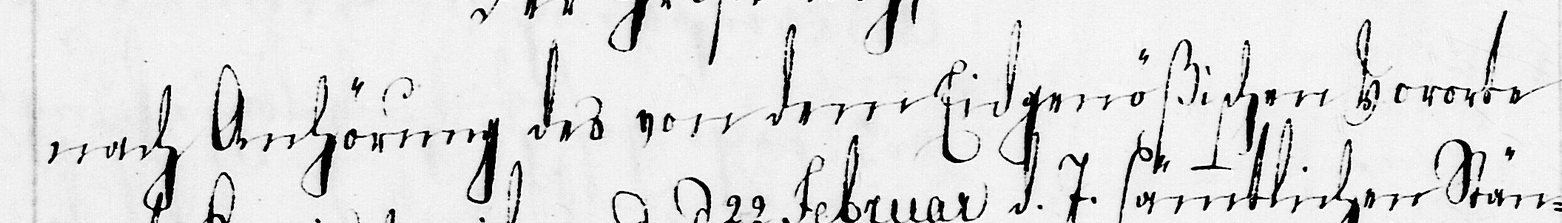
nach Anhörung des von dem Eidgenößischen Vororte
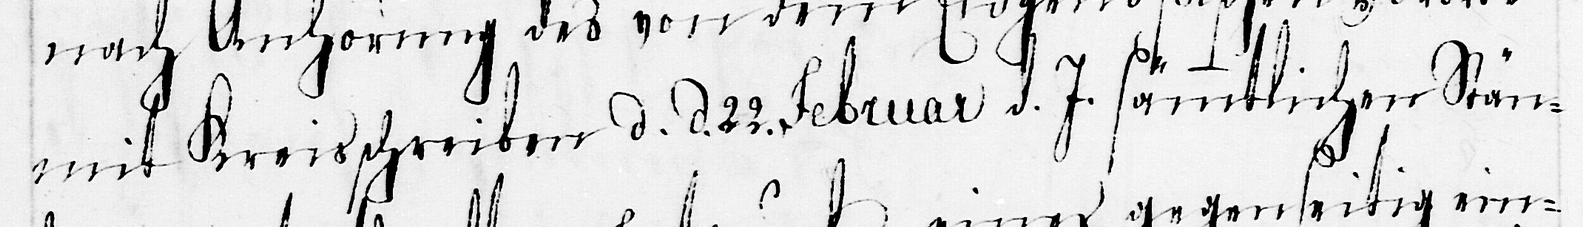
mit Kreisschreiben d. d. 22. Februar d. J. sämmtlichen Stän¬
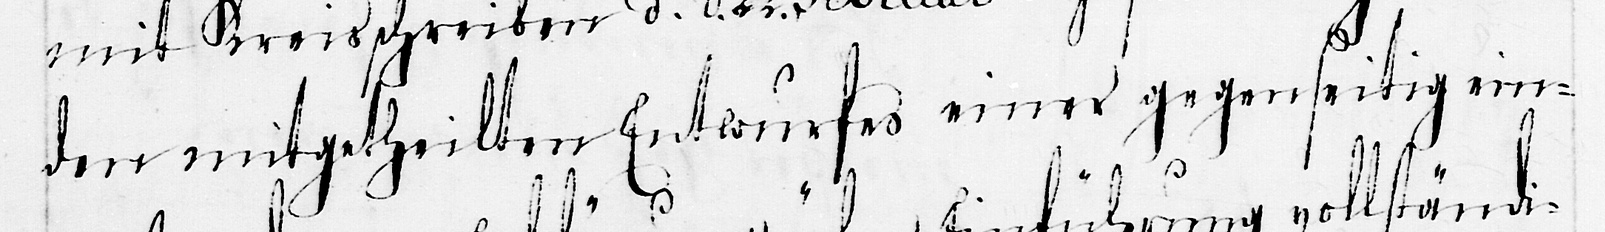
den mitgetheilten Entwurfes einer gegenseitig ein¬
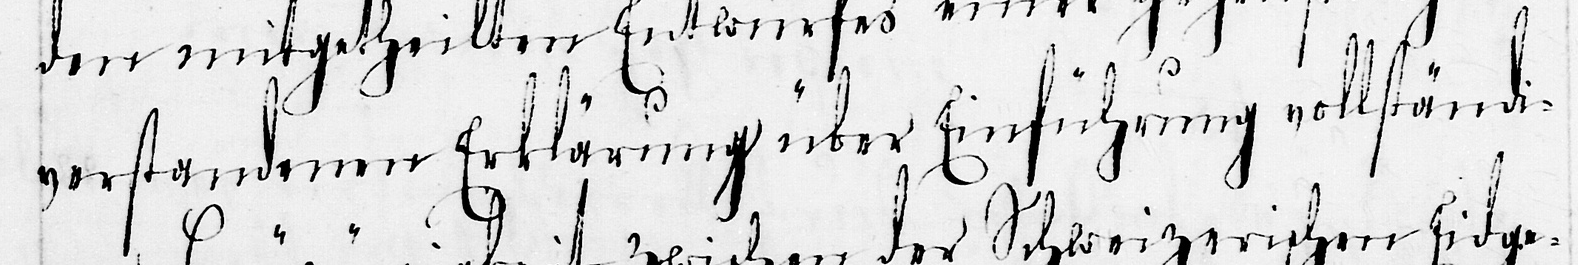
verstandenen Erklärung über Einführung vollständi¬
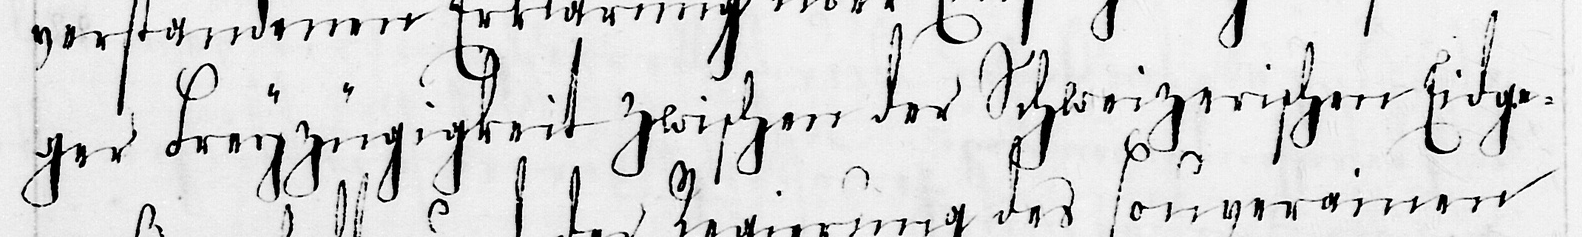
ger Freyzügigkeit zwischen der Schweizerischen Eidge¬
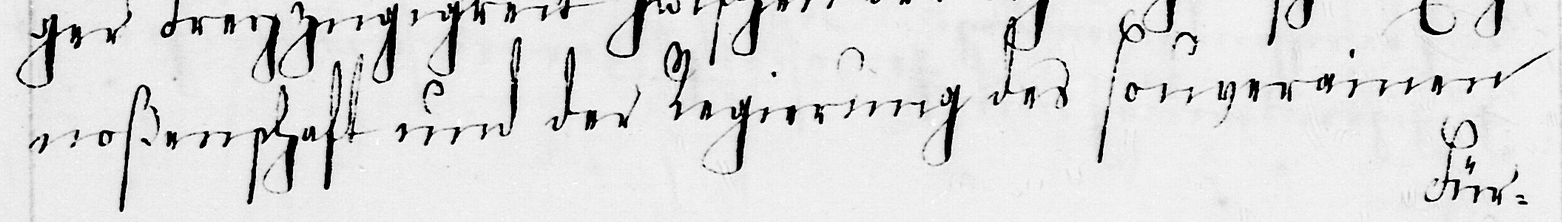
noßenschaft und der Regierung des souverainen
